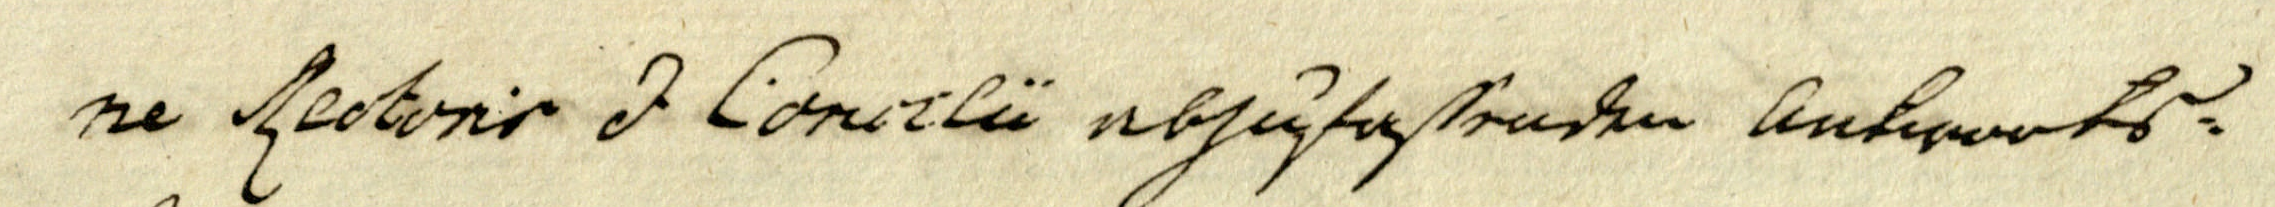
ne Rectoris et Concilii abzufassenden Antworts¬
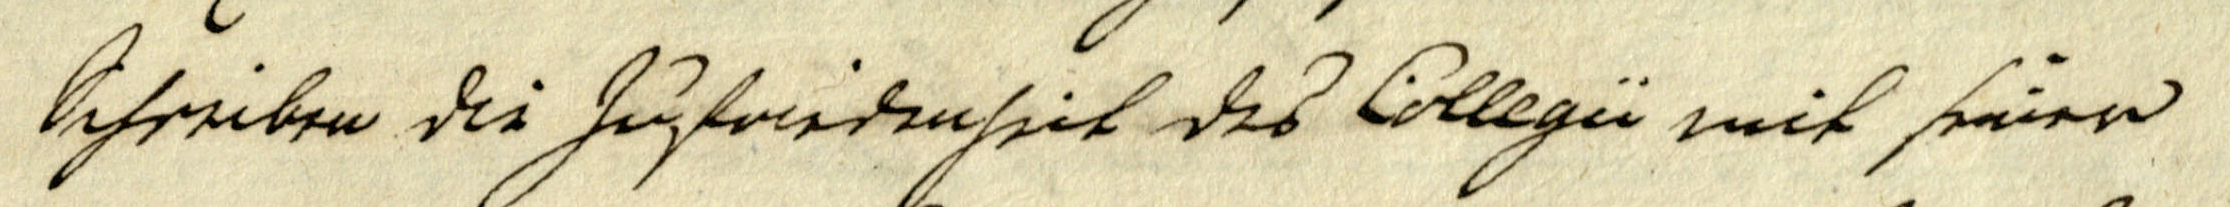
Schreiben die Zufriedenheit des Collegii mit seiner
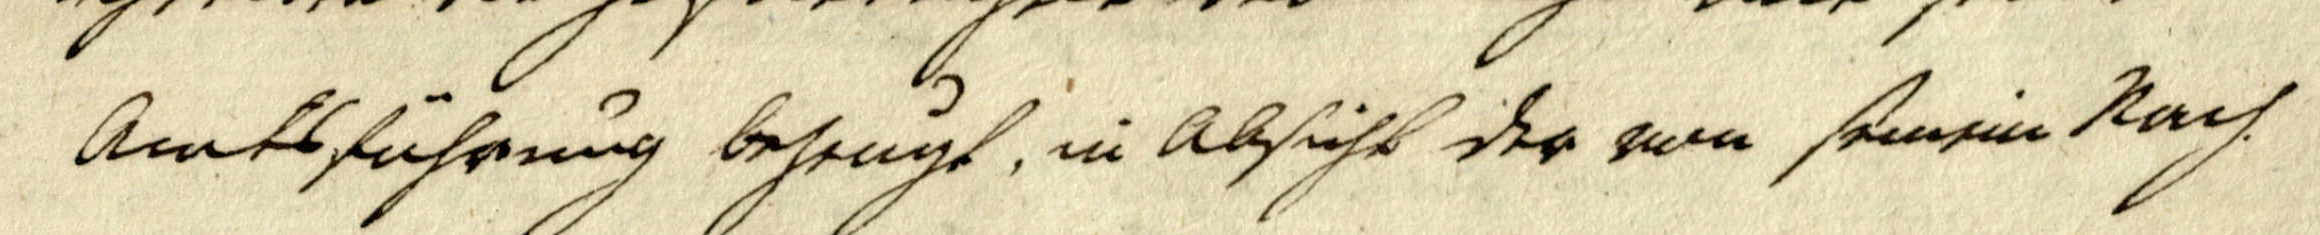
Amtsführung bezeugt, in Absicht der von seinem Nach¬
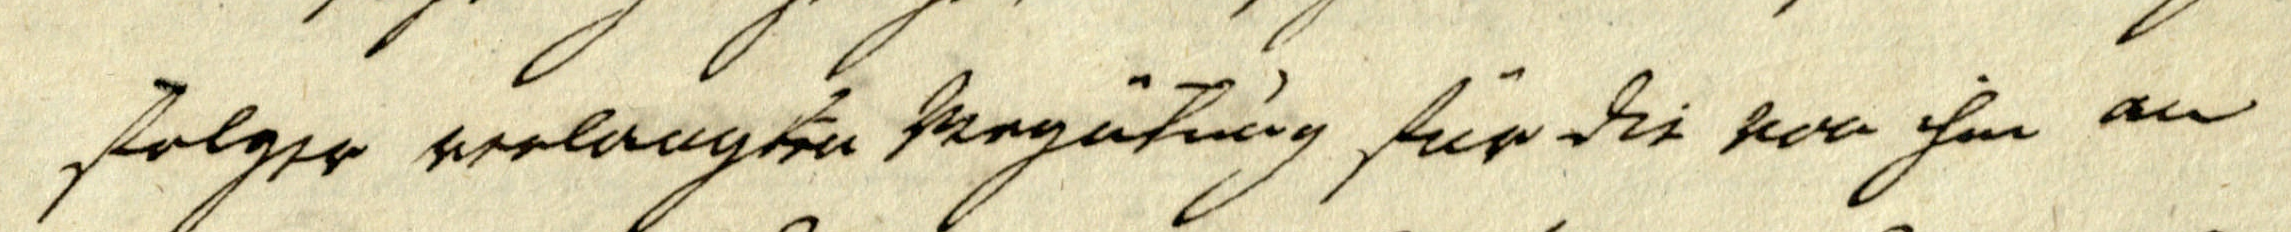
folger verlangten Vergütung für die von ihm an
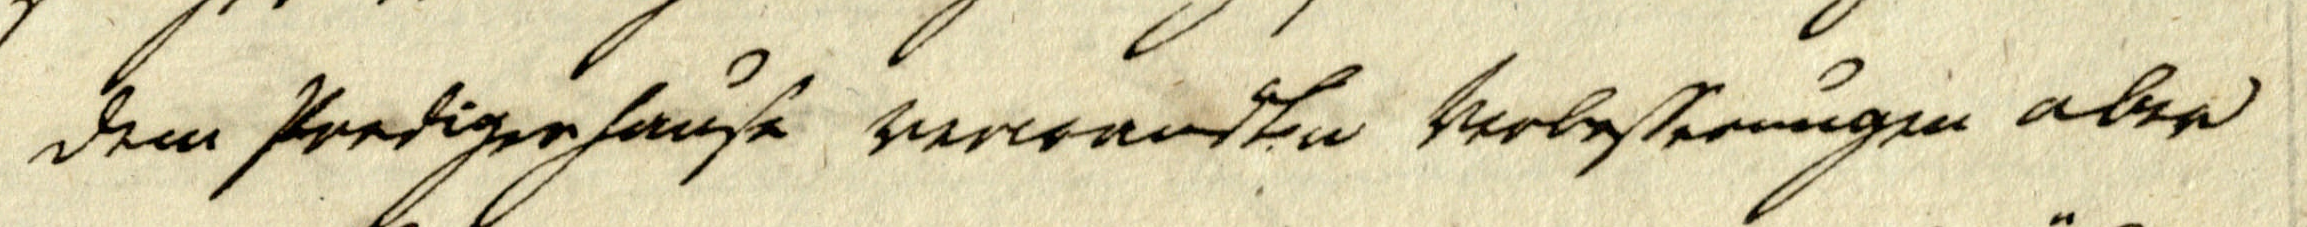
dem Predigerhause verwandten Verbesserungen aber
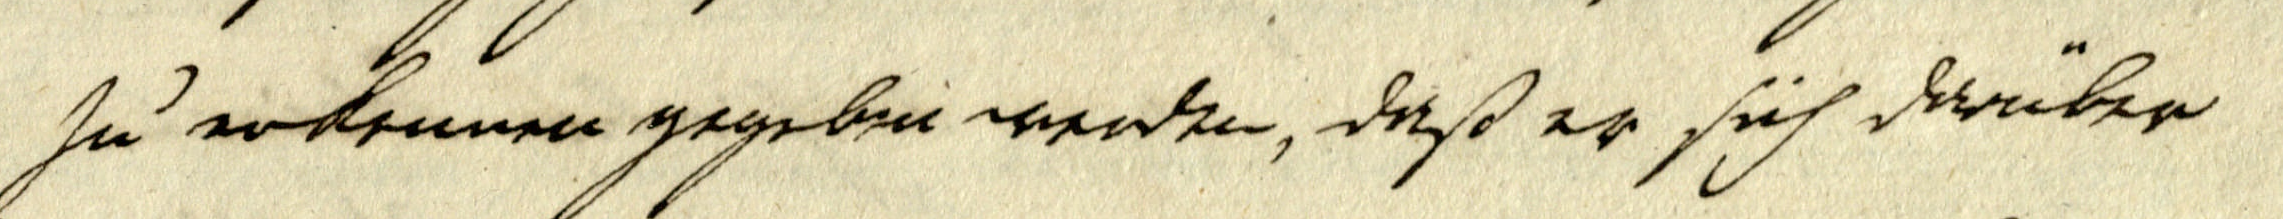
zu erkennen gegeben werden, daß er sich darüber
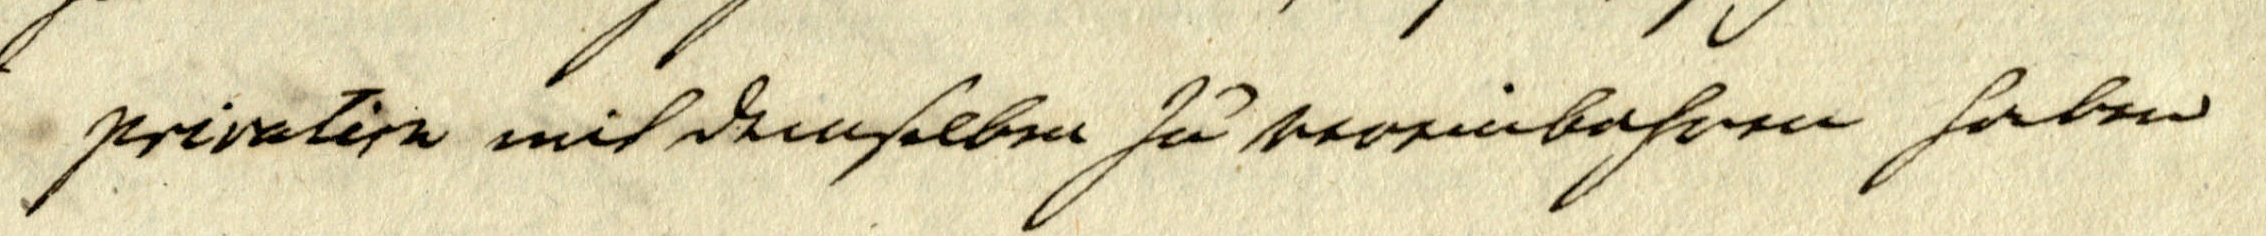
privatim mit demselben zu vereinbahren haben
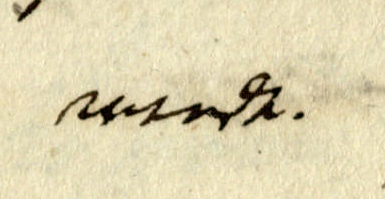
werde.
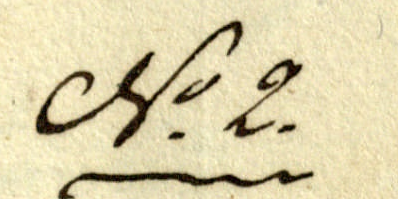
Nº 2.
